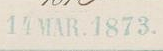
8 Mars, 1873
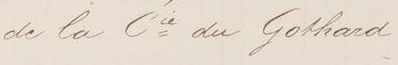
de la Cie du Gothard
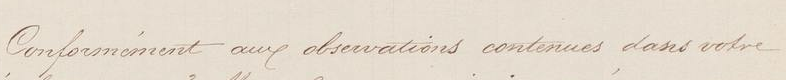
Conformément aux observations contenues dans votre
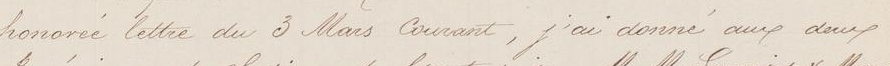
honorée lettre du 3 Mars Courant, j'ai donné aux deux
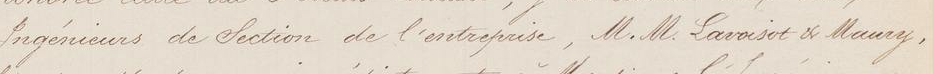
Ingénieurs de Section de l'entreprise, M.M. Lavoisot & Maury,
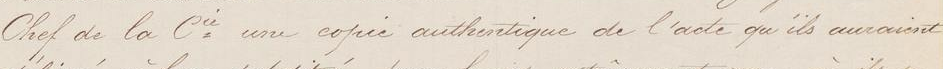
Chef de la Cie une copie authentique de l'acte qu'ils auraient
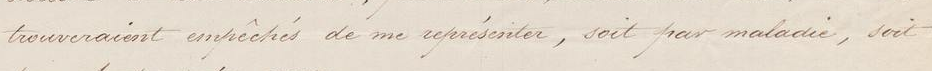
trouveraient empêchés de me représenter, soit par maladie, soit
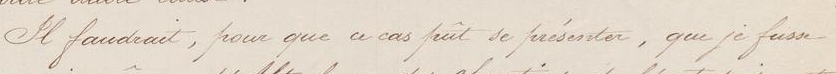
Il faudrait, pour que ce cas pût se présenter, que je fusse
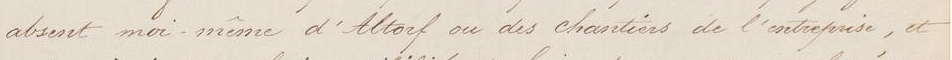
absent moi-même d'Altorf ou des chantiers de l'entreprise, et
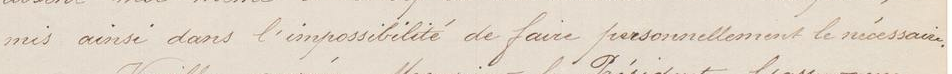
mis ainsi dans l'impossibilité de faire personnellement le nécessaire.
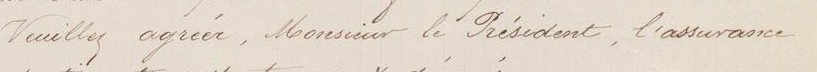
Veuillez agréer, Monsieur le Président, l'assurance
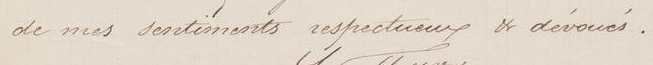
de mes sentiments respectueux & dévoués.
